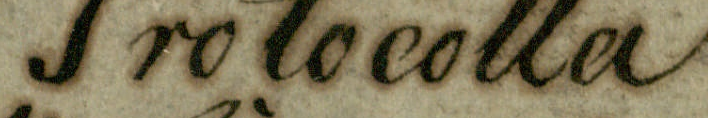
Protocolla
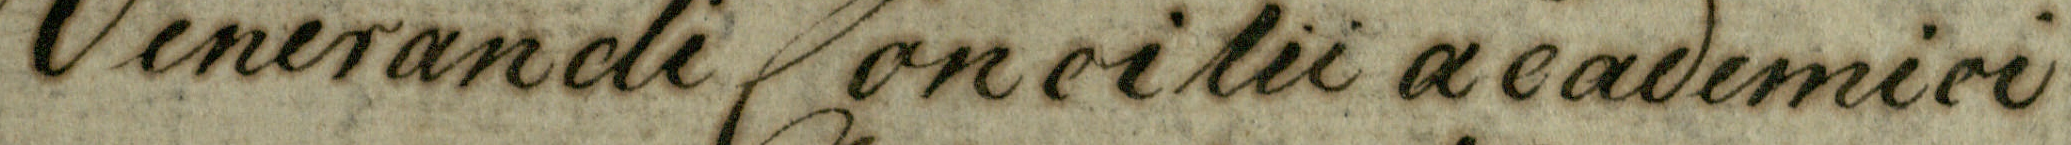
Venerandi Concilii academici
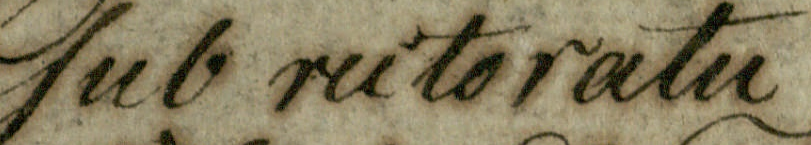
sub rectoratu
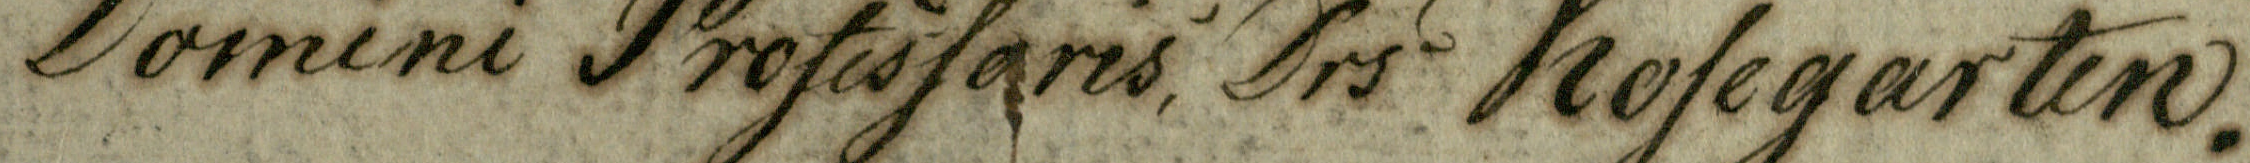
Domini Professoris Drs. Kosegarten
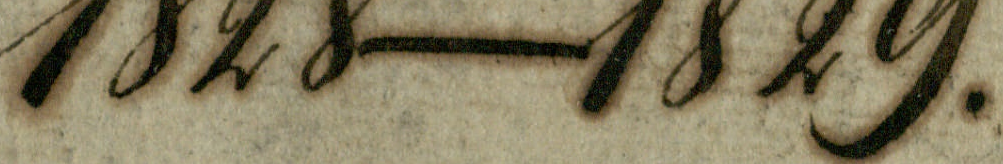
1828-1829
